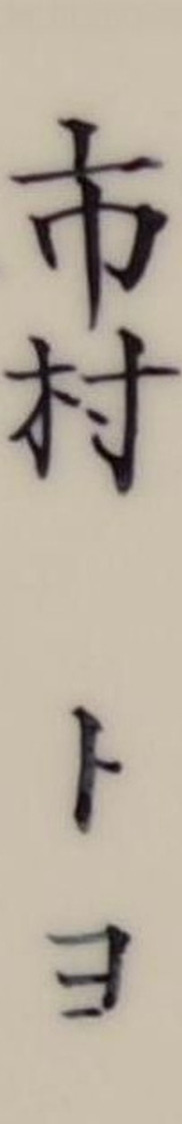市村トヨ
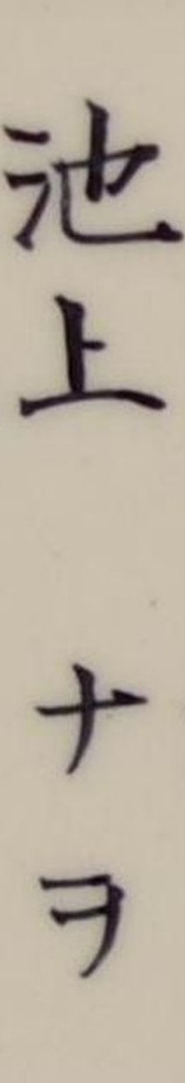池上ナヲ
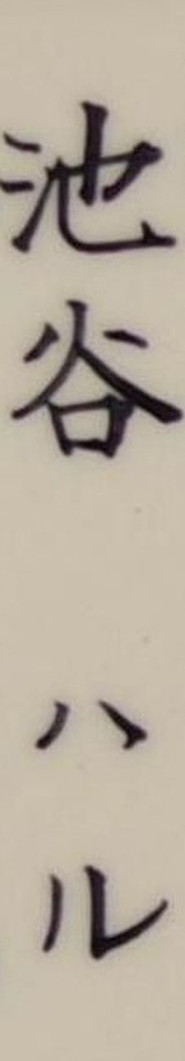池谷ハル
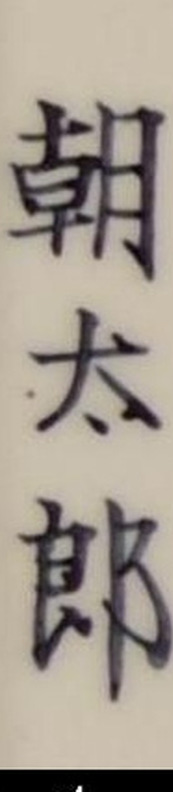朝太郎

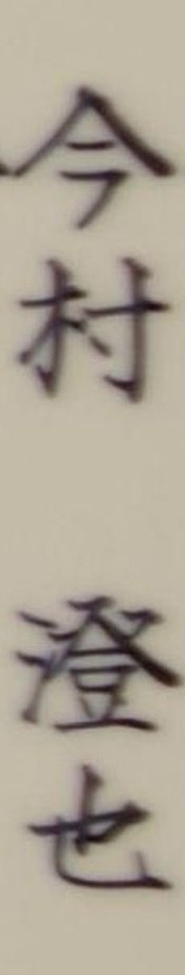今村澄也
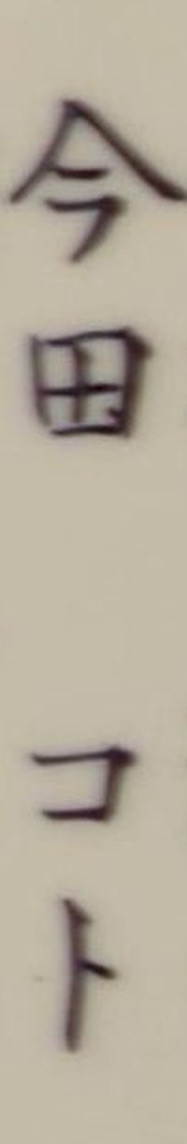今田コト
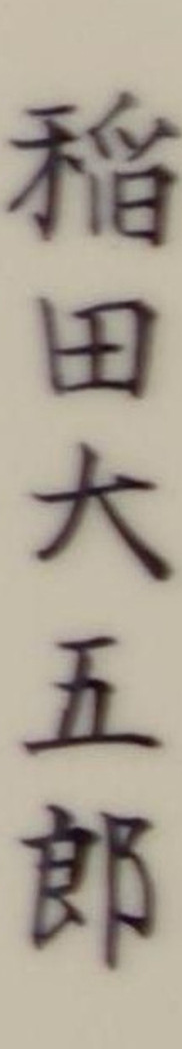稲田大五郎
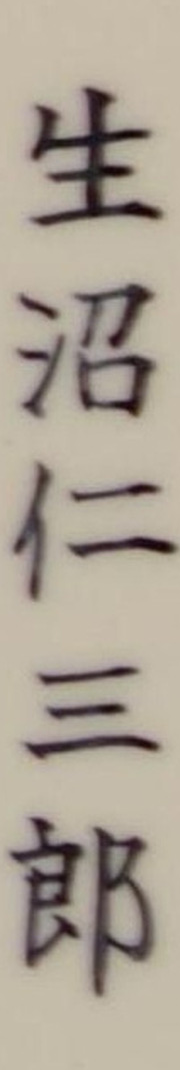生沼仁三郎
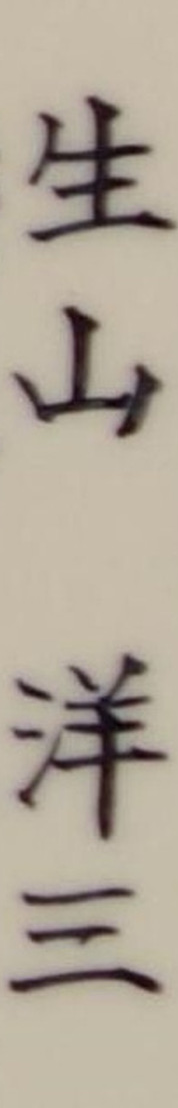生山洋三
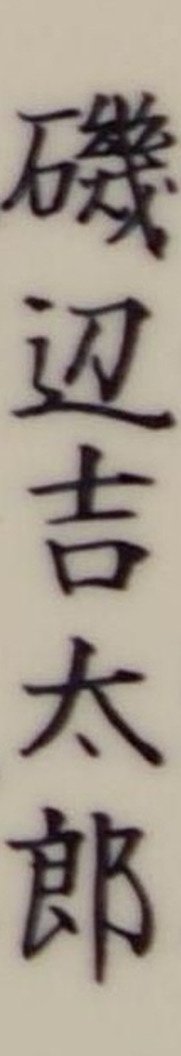磯辺吉太郎
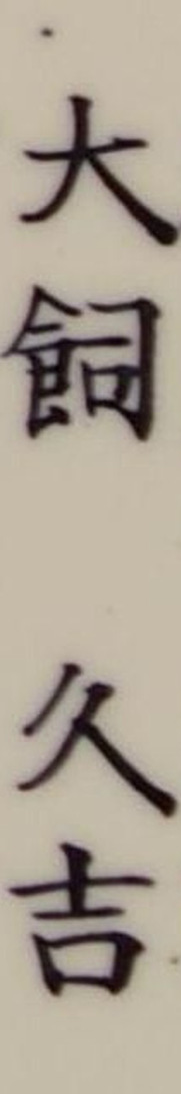大飼久吉
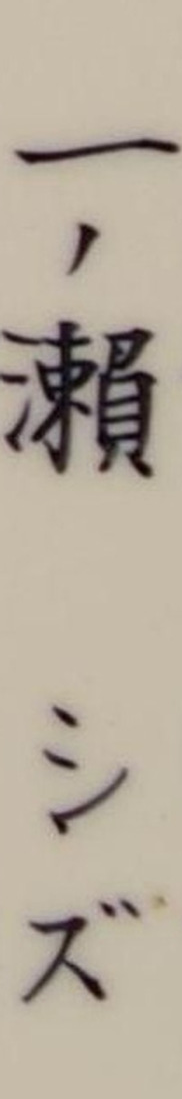一ノ瀬シズ
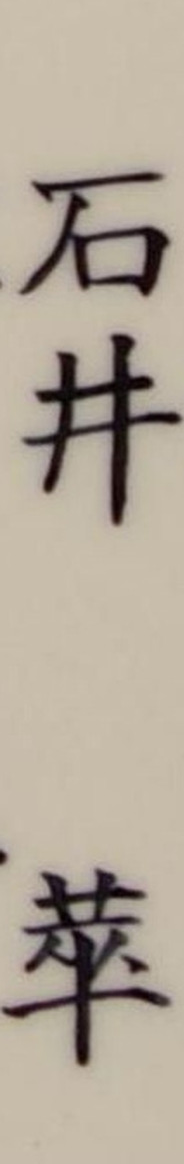石井萃
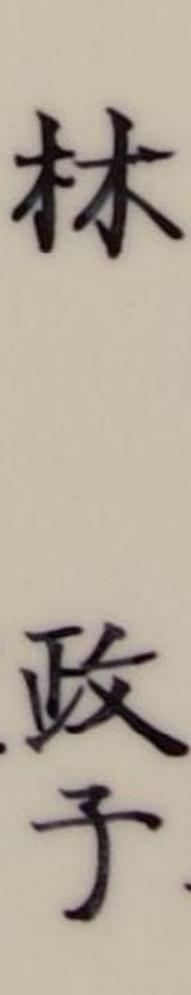林政子
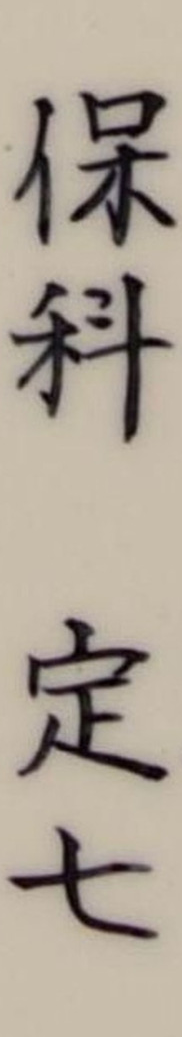保科定七
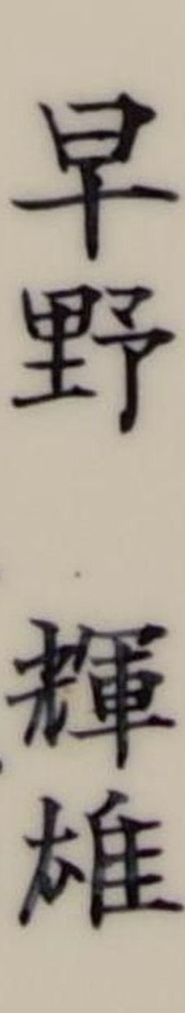早野輝雄
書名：M~S
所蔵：高野山金剛峯寺
